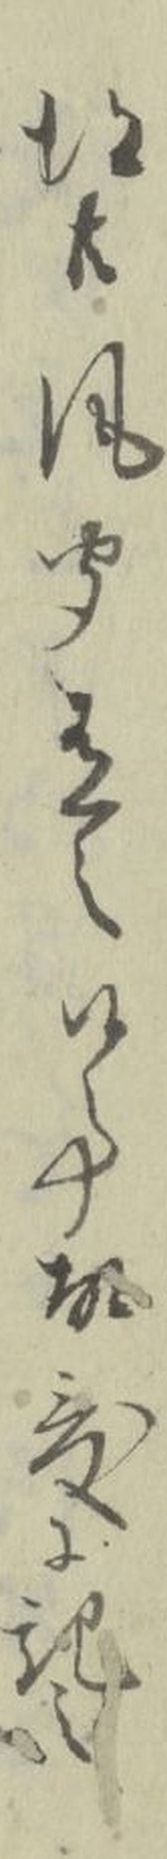得共風聞有之候事故度に記之
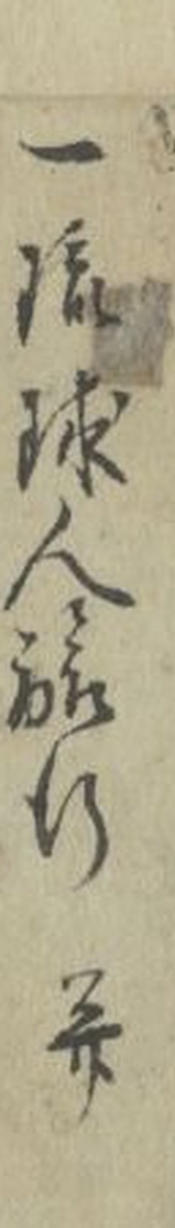一琉球人旅行幷
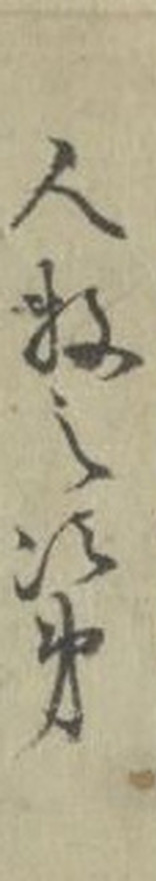人数之次第
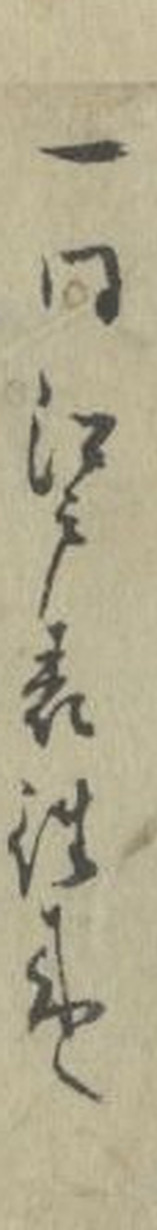一同江戸表往来之
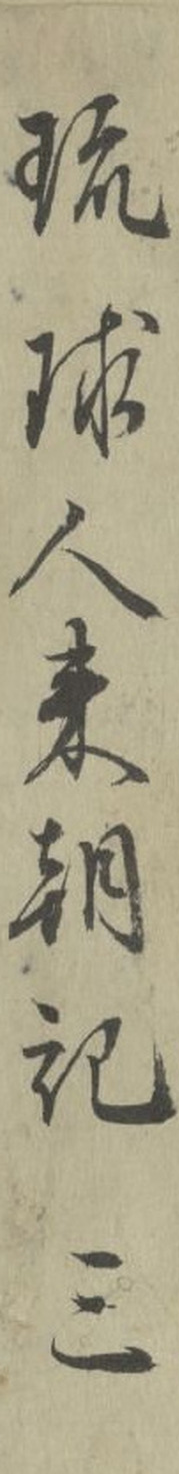琉球人来朝記三

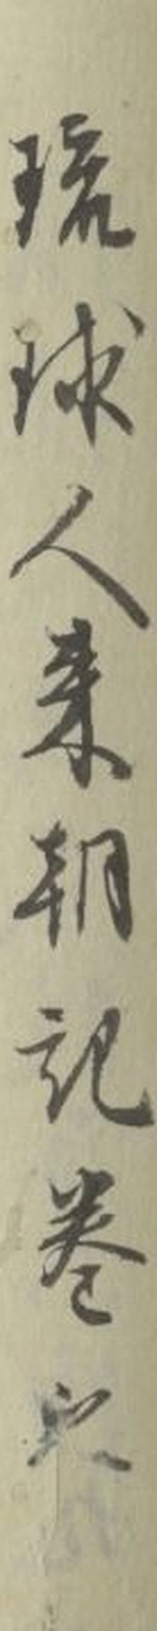琉球人来朝記巻之
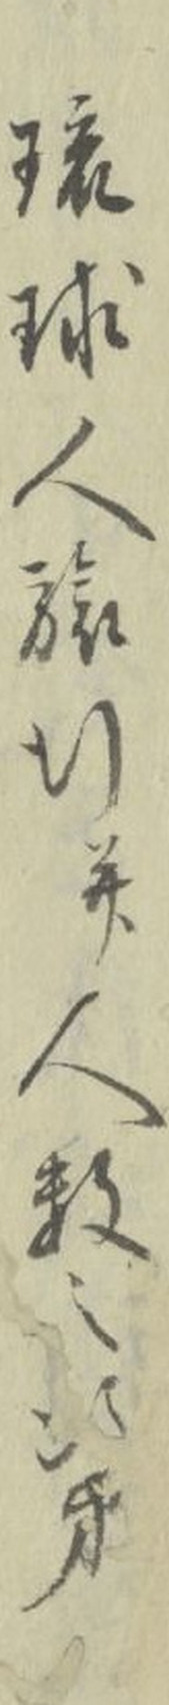琉球人旅行幷人数之次第
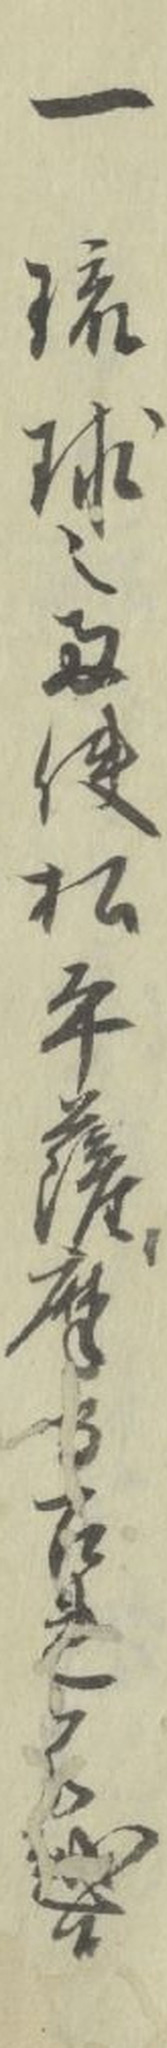一琉球之両使松平薩摩守召連罷越候
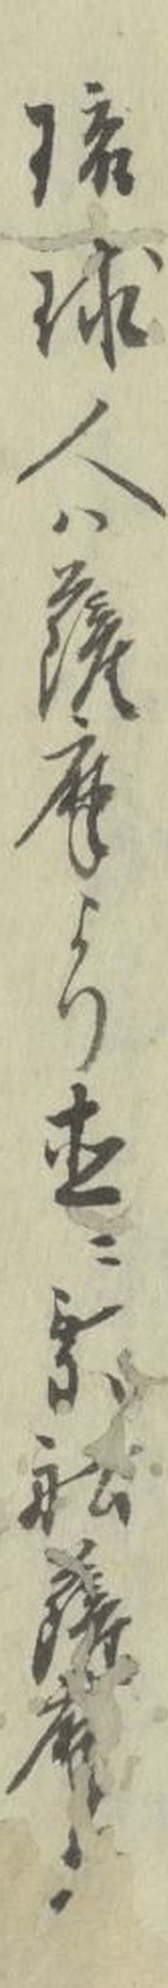琉球人は薩摩より直に乗船薩摩守
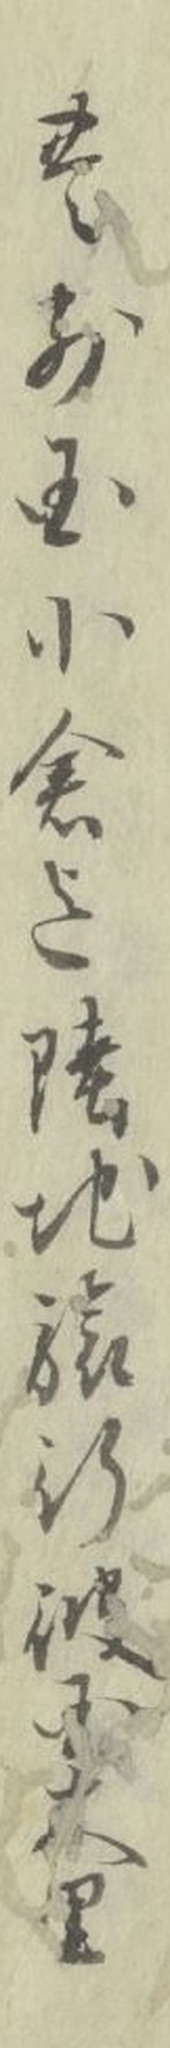豊前国小倉迄陸地旅行彼国大里
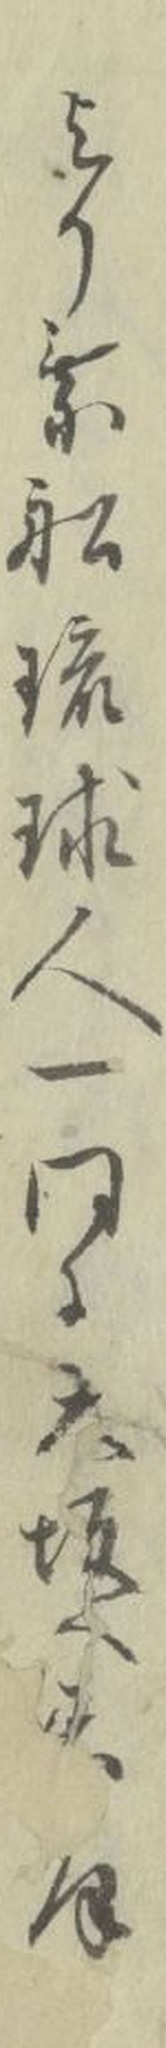より乗船琉球人一同に大阪へ着津

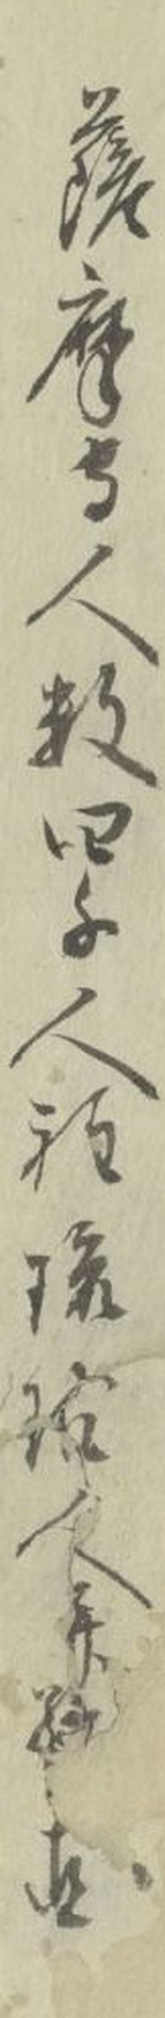薩摩守人数四千人程琉球人幷警固
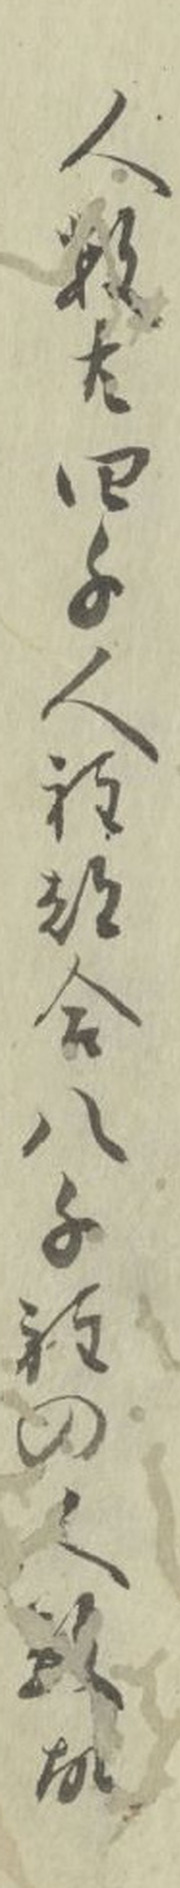人数共四千人程都合八千程の人数故
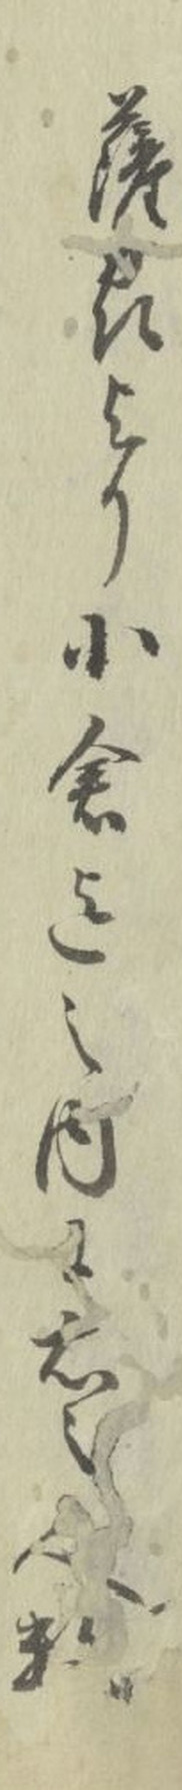薩州より小倉迄之内に右之人数
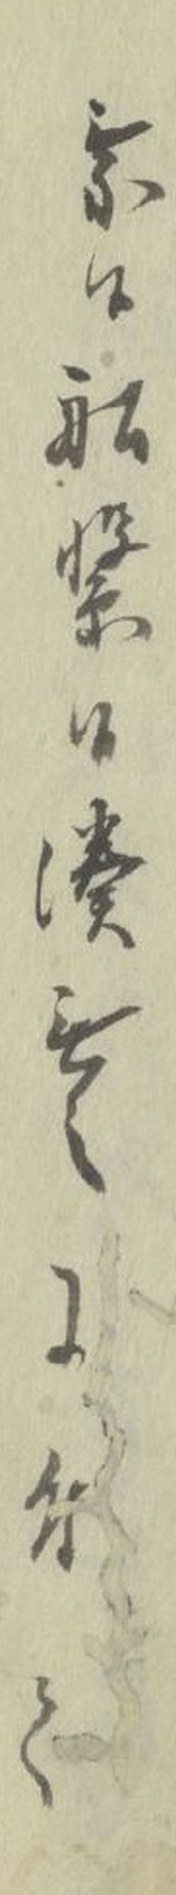乗候船繋候湊無之に付て
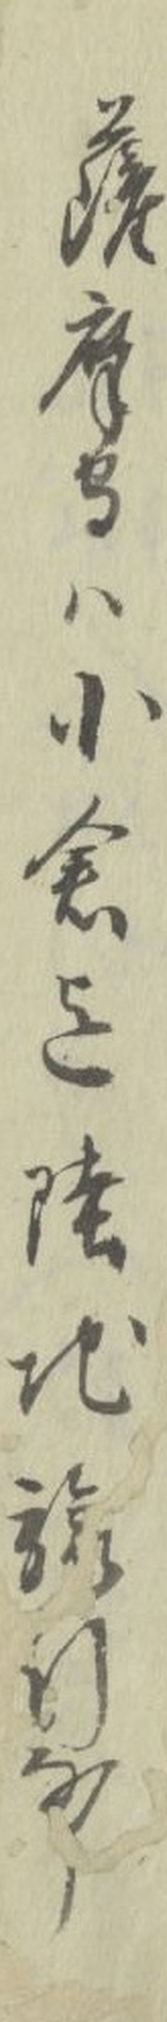薩摩守は小倉迄陸地旅行なし
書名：琉球来朝記 自一至七
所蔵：University of the Ryukyus Library
